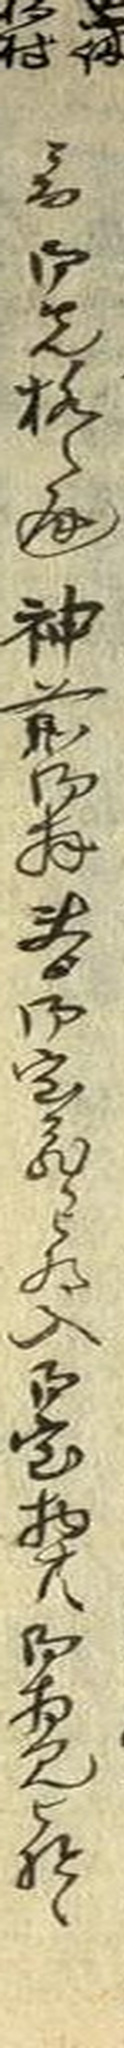ニ而御先格之通神前御拝夫ゟ御宝蔵被為入御宝物共御拝見被遊候
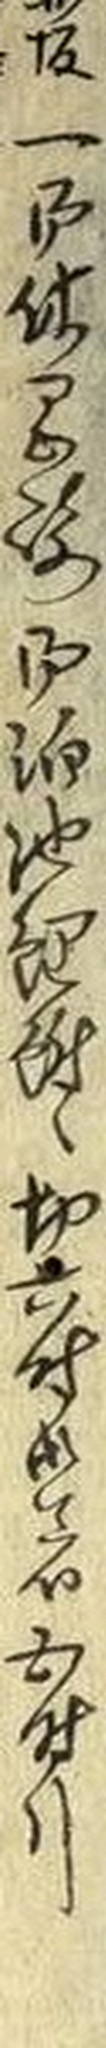一御休岡崎御泊池鯉鮒へ切六時御着五時引
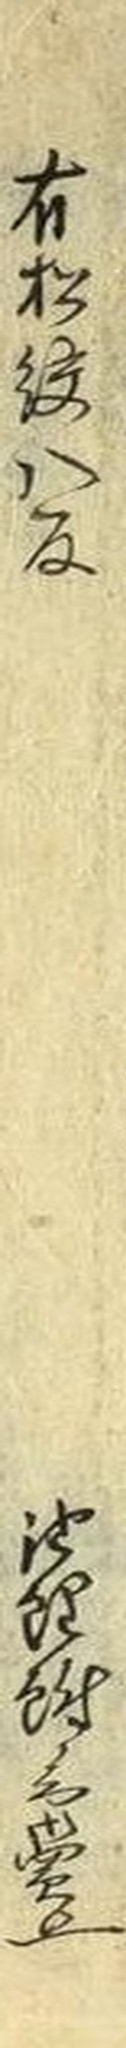有松絞八反池鯉鮒ニ而御買上
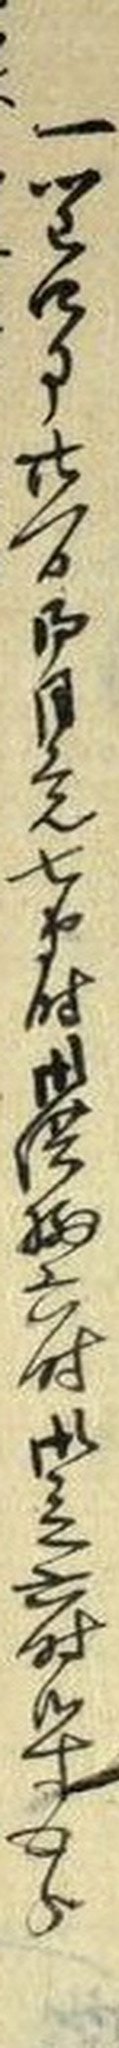一閏四月廿一日御目覚七半時御供揃六時御立六時弐寸五分
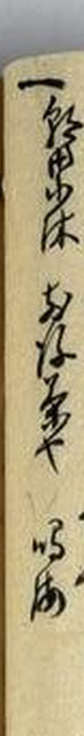一朝小休前後茶屋鳴海
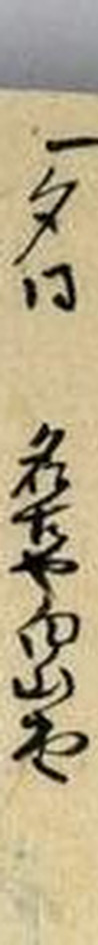夕同名古屋白山堂
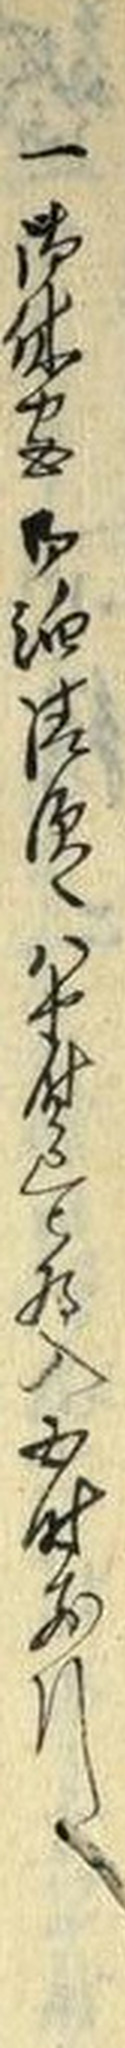一御休宮御泊清須へ八半時過被為入五時前引
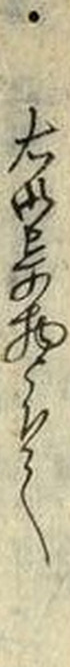右御寄物被下之
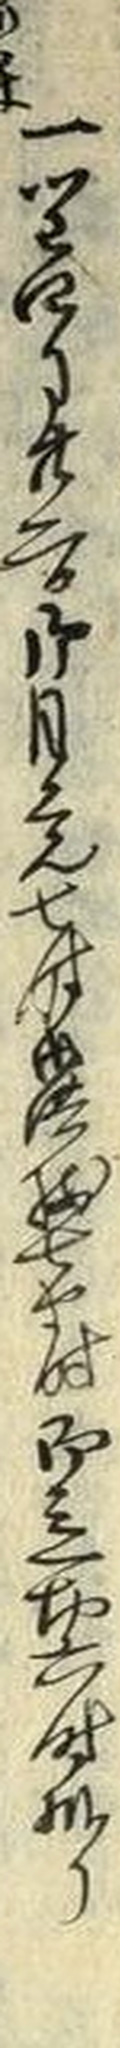一閏四月廿二日御目覚七時御供揃七半時御立切六時掛り
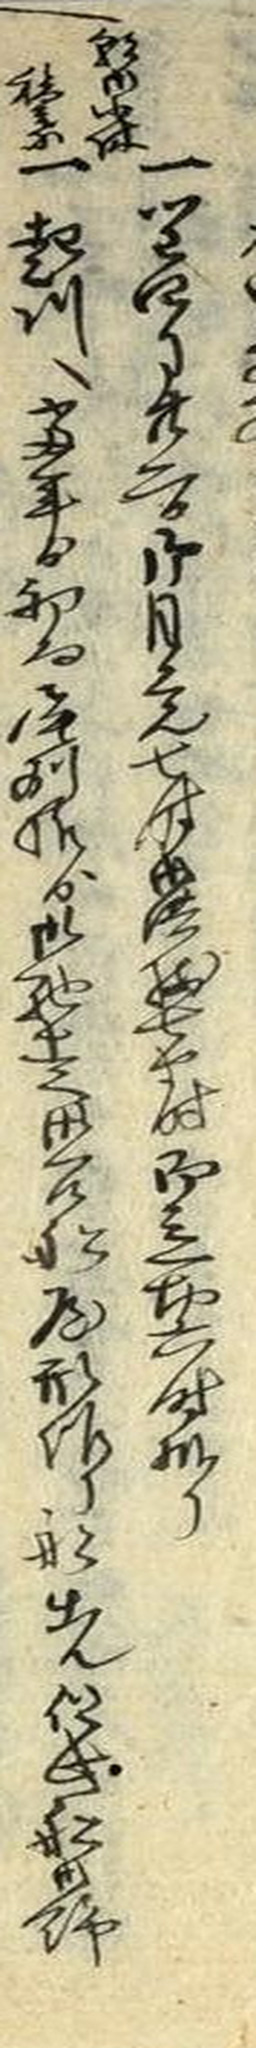一起川へ当年ゟ初而尾州様ゟ御馳走御召船屋形作り船出ㇽ但此船御飾
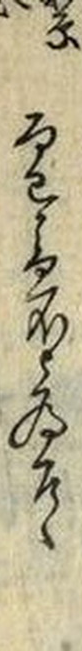而己ニ而不被為召候
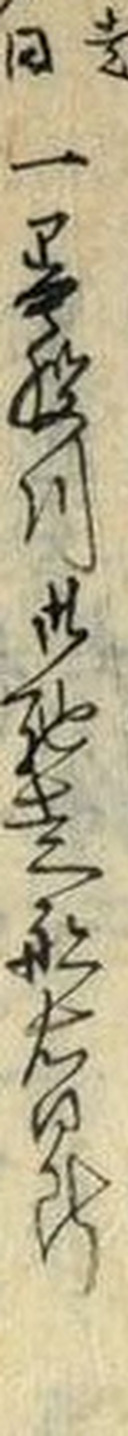一墨股川御馳走船右同断
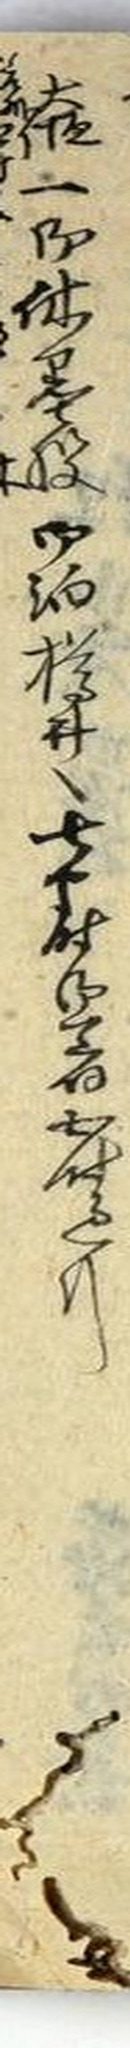一御休墨股御泊樽井へ七半時御着五時過引
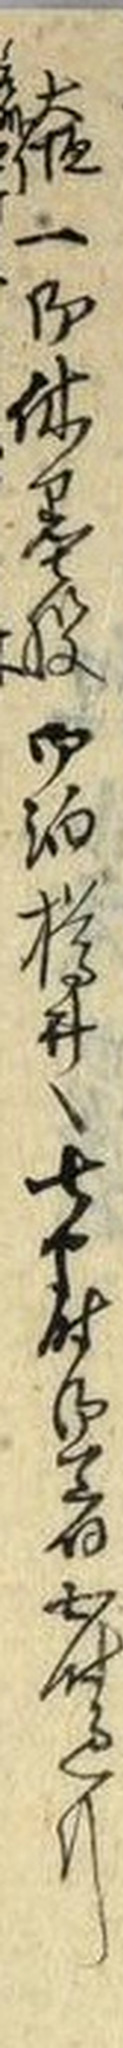一御休墨股御泊樽井へ七半時御着五時過引

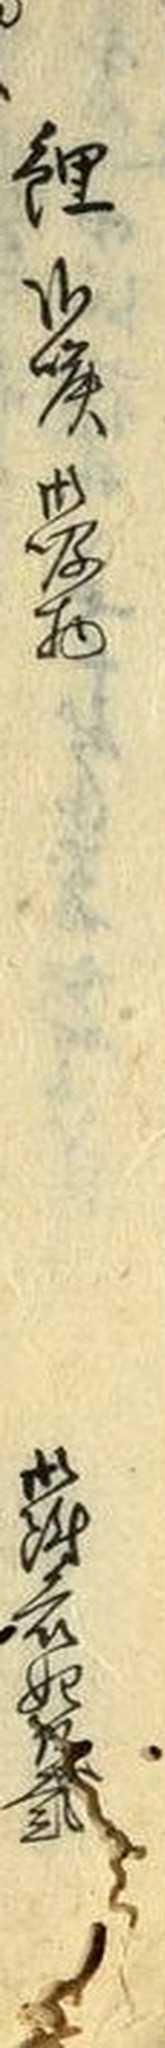鯉弐喉御吸物御附衆始頂戴
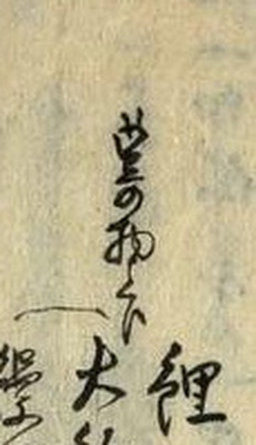御寄物被下
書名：少傅日録抄（斉善付側向頭取日記、江戸并道中、初入在国、逝去後…
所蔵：福井県文書館 Fukui Prefectural Archives
